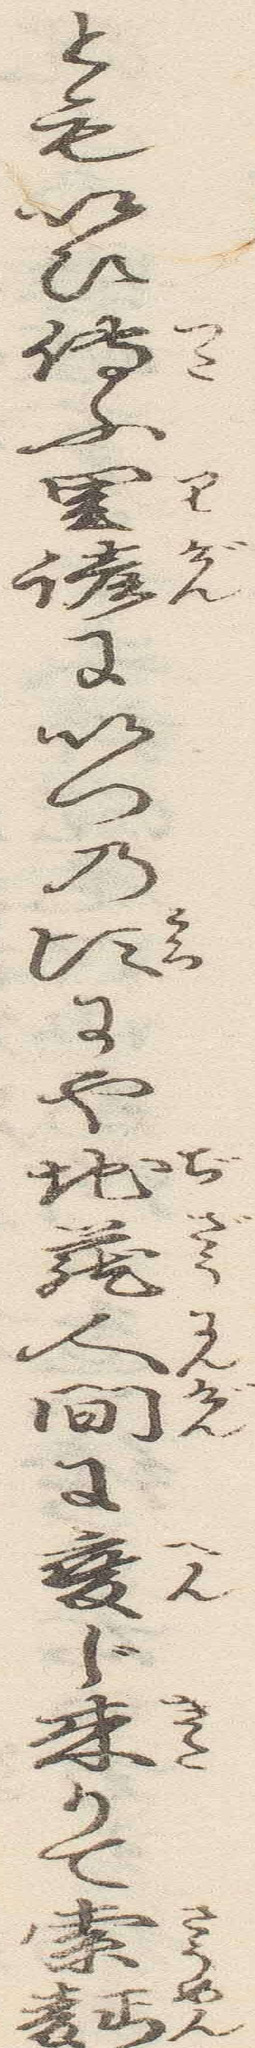ともいひ傳ふ里諺にいつの頃にや地蔵人間に変じ來りて索麪
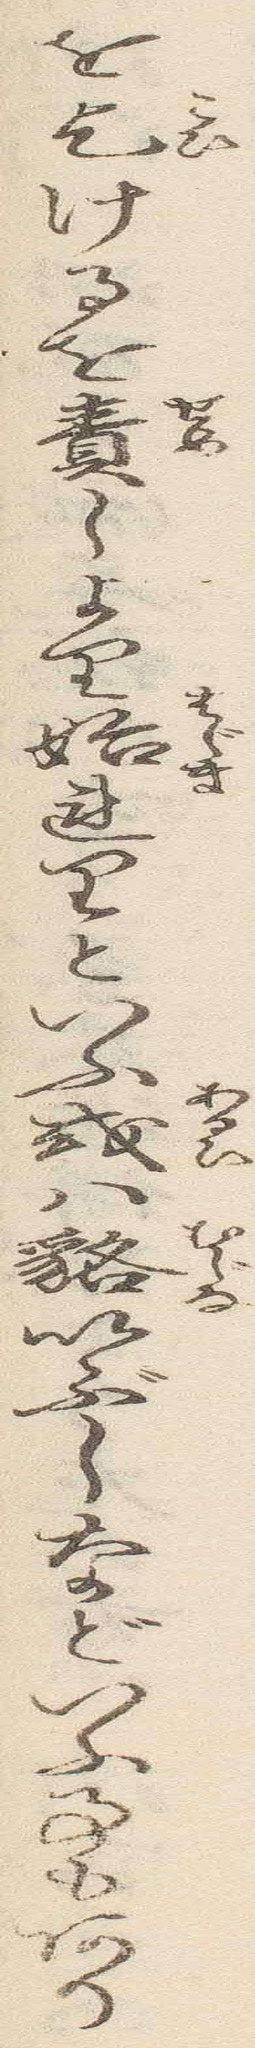を乞けるを責しより始れりといふ或は貉いぶしなどいふ事もあり
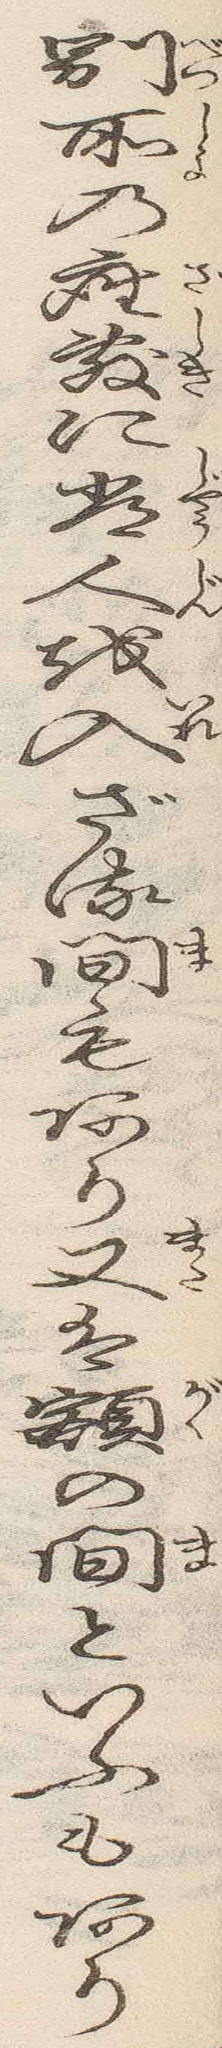別所の座敷に常人を入ざる間もあり又は額の間といふもあり
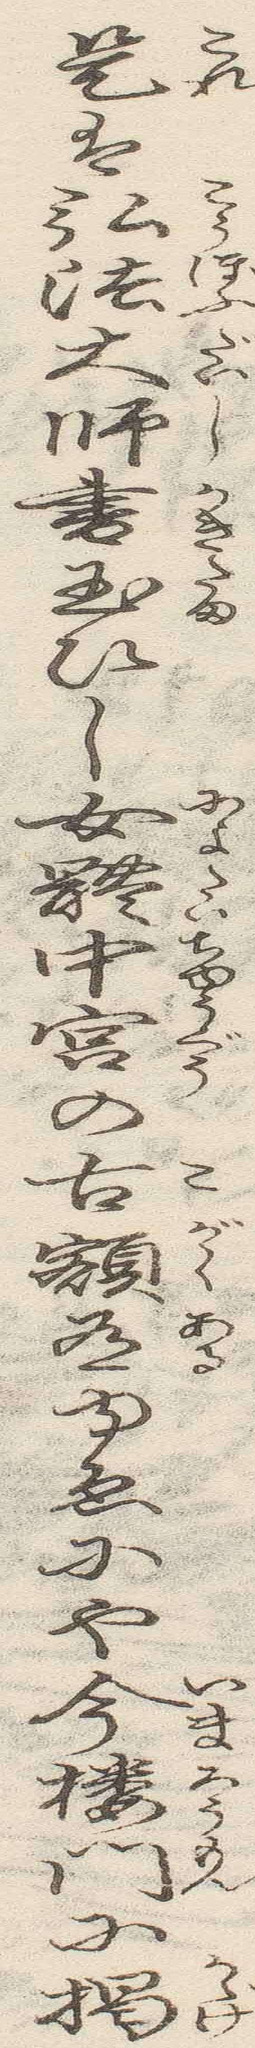是は弘法大師書玉ひし女體中宮の古額有ゆゑにや今楼門に掲
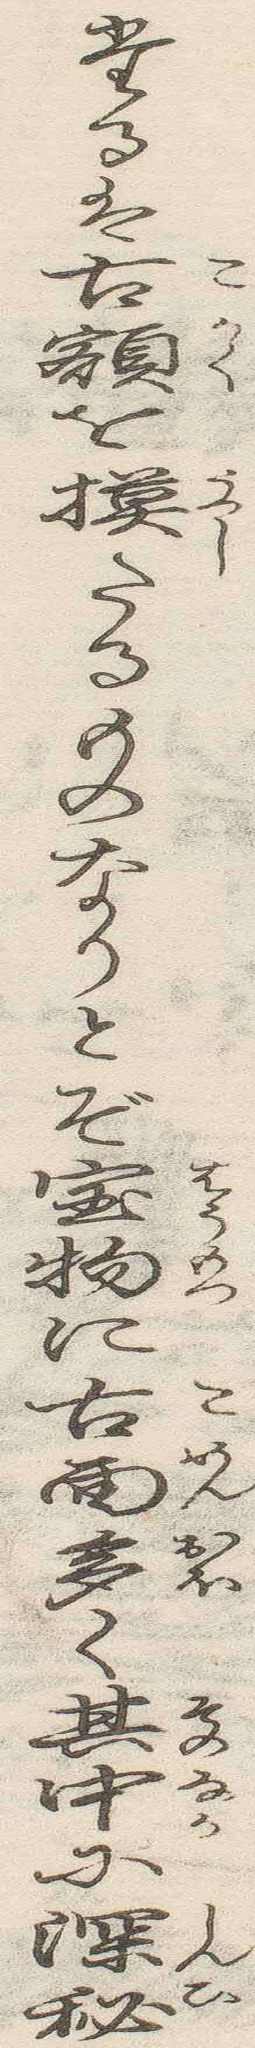たるは古額を摸たるものなりとぞ宝物に古面多く其中に深秘
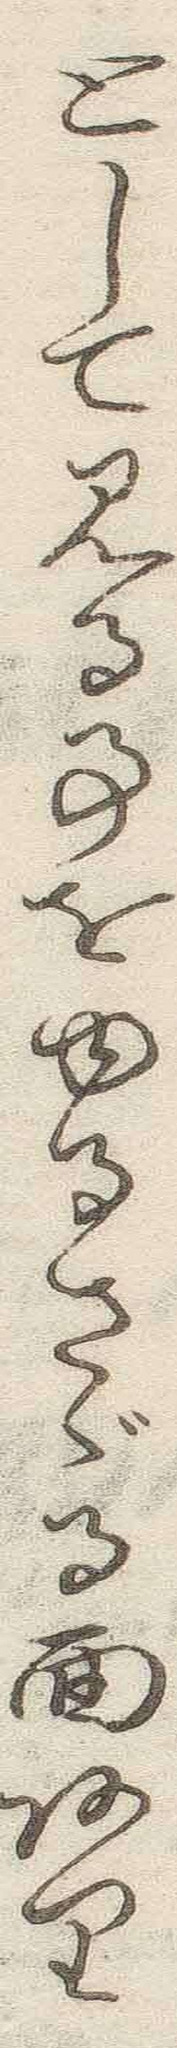として見る事をゆるさゞる面あり
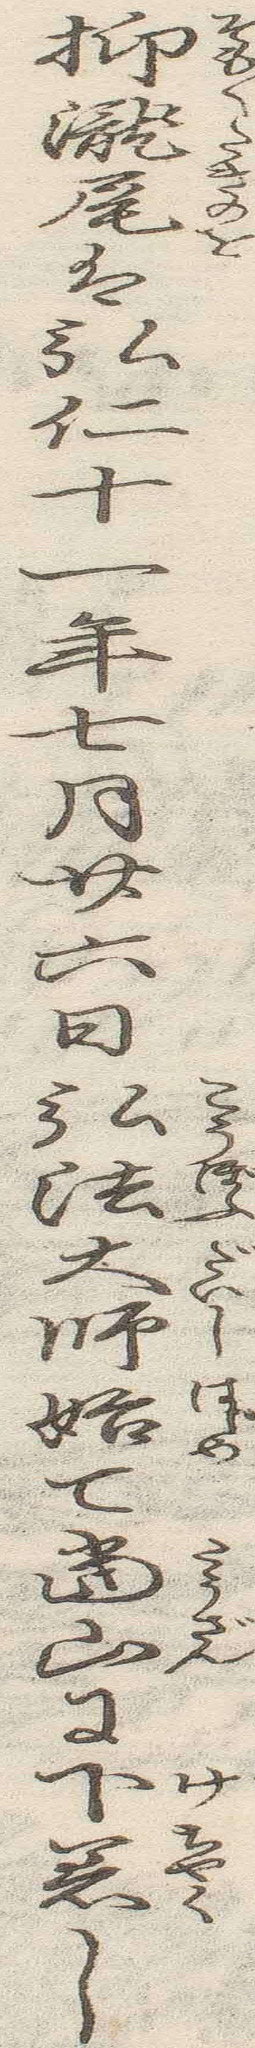抑瀧尾は弘仁十一年七月廿六日弘法大師始て當山に下着し
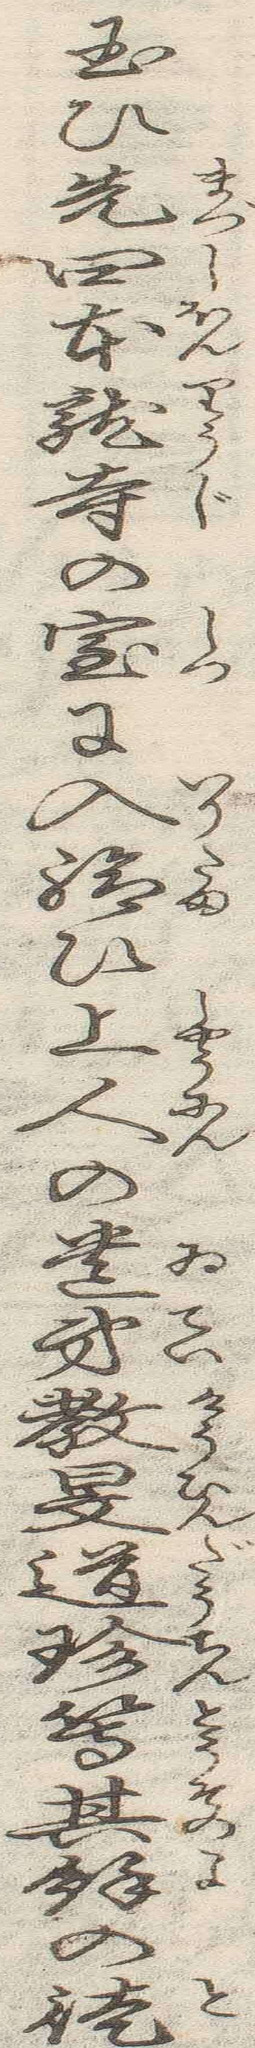玉ひ先四本龍寺の室に入給ひ上人の遺㐧敎旻道珍等其餘の徒
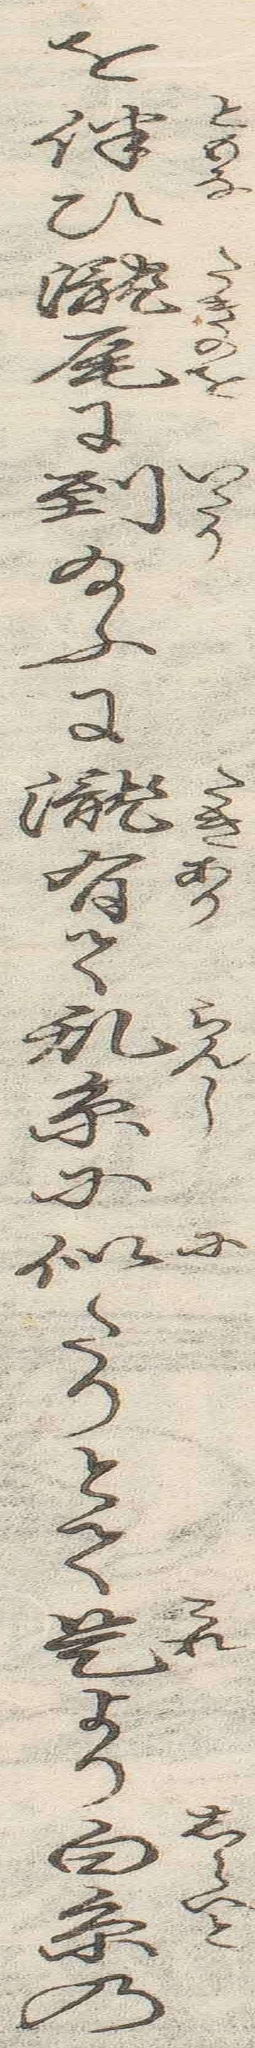を伴ひ瀧尾に到給ふに瀧有て乱糸に似たりとて是より白糸の
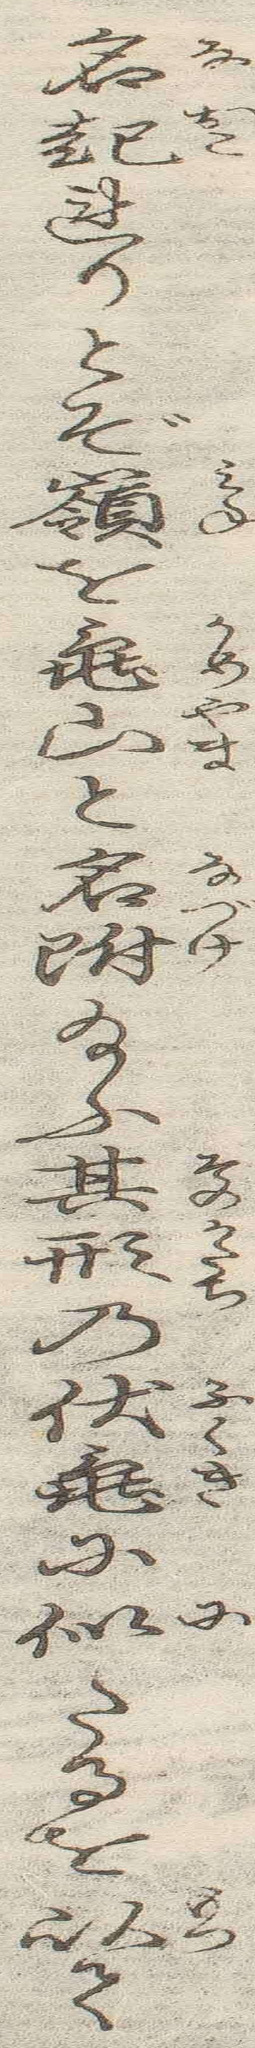名起れりとぞ嶺を龜山と名附給ふ其形の伏龜に似たるを以て
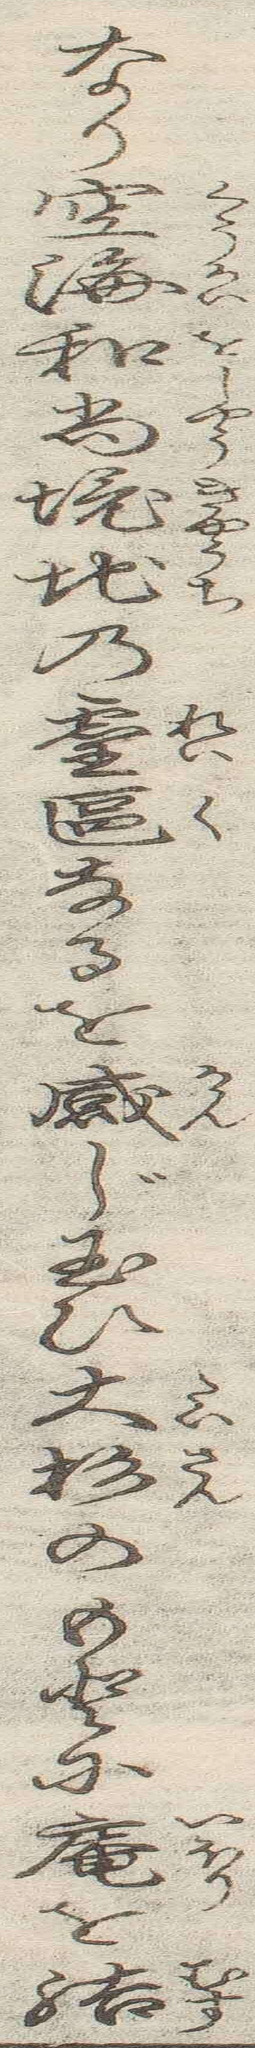なり空海和尚境地の靈區なるを感じ玉ひ大杉のもとに庵を結
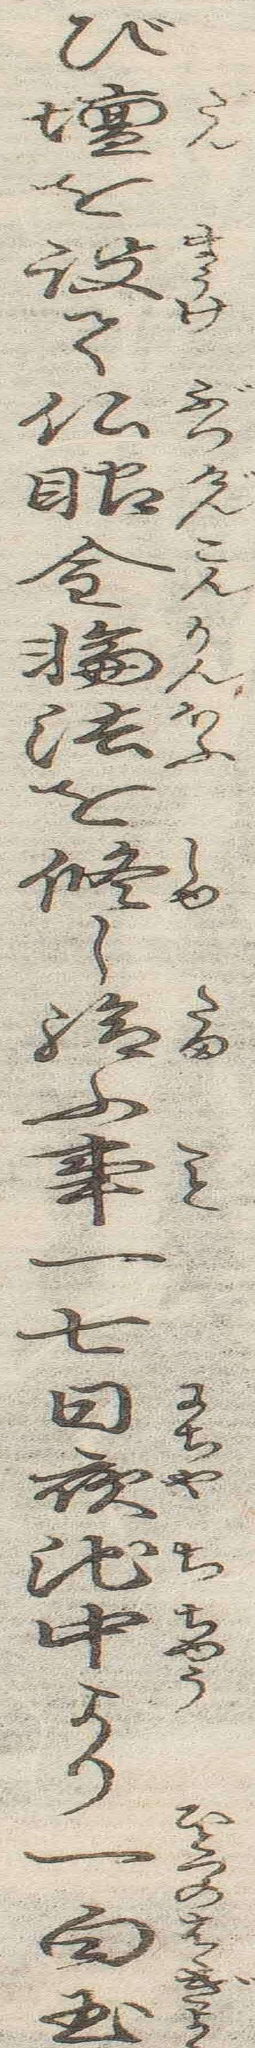び壇を設て仏眼金輪法を修し給ふ事一七日夜地中より一白玉
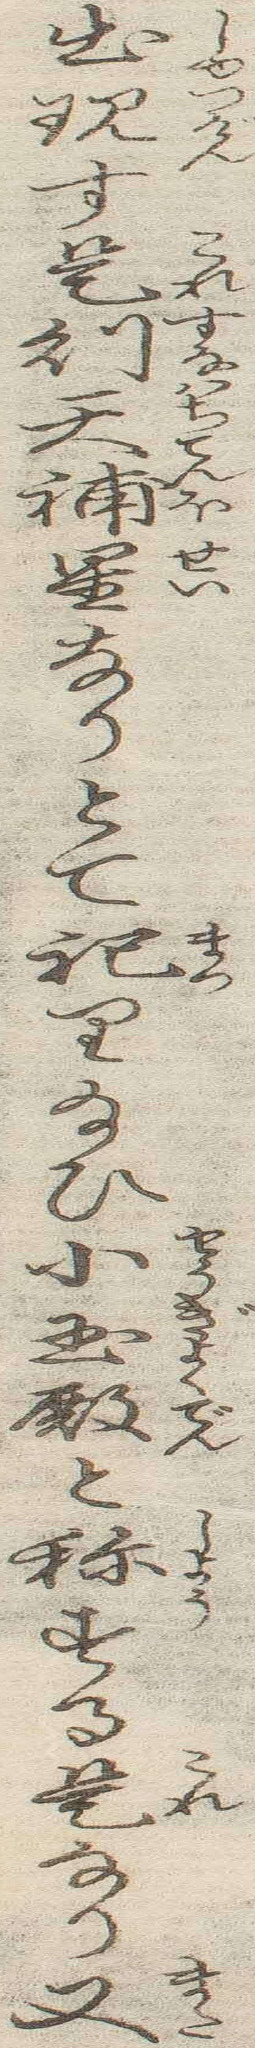出現す是則天補星なりとて祀り給ひ小玉殿と称する是なり又
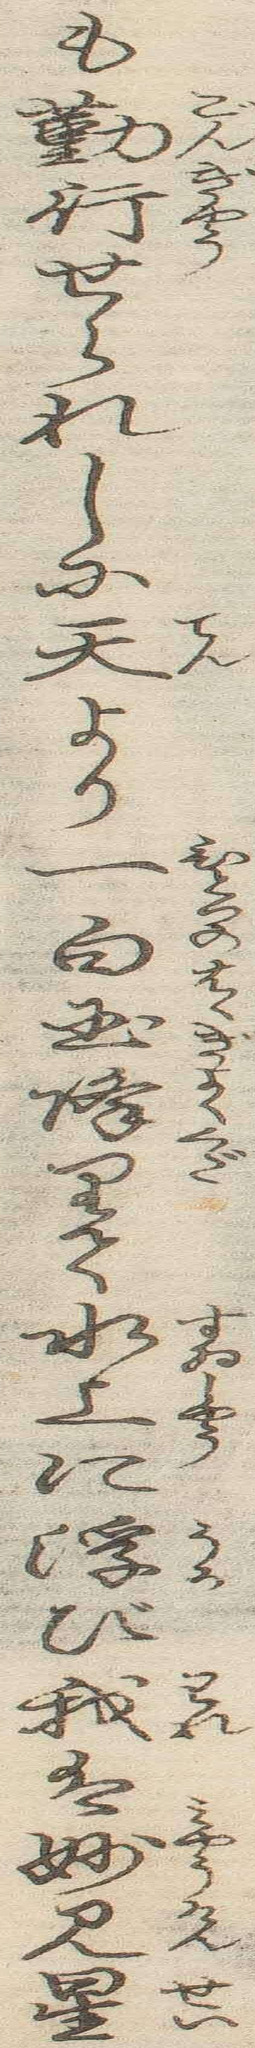も勤行せられしに天より一白玉降りて水上に浮び我は妙見星

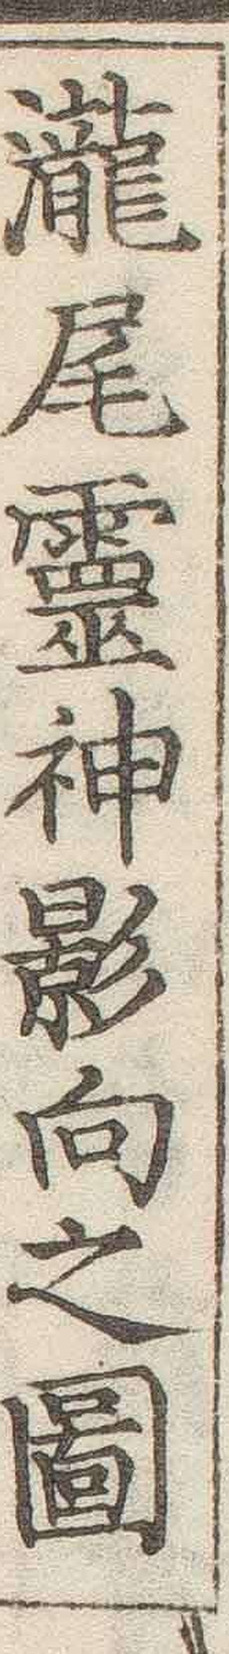瀧尾靈神影向之圖

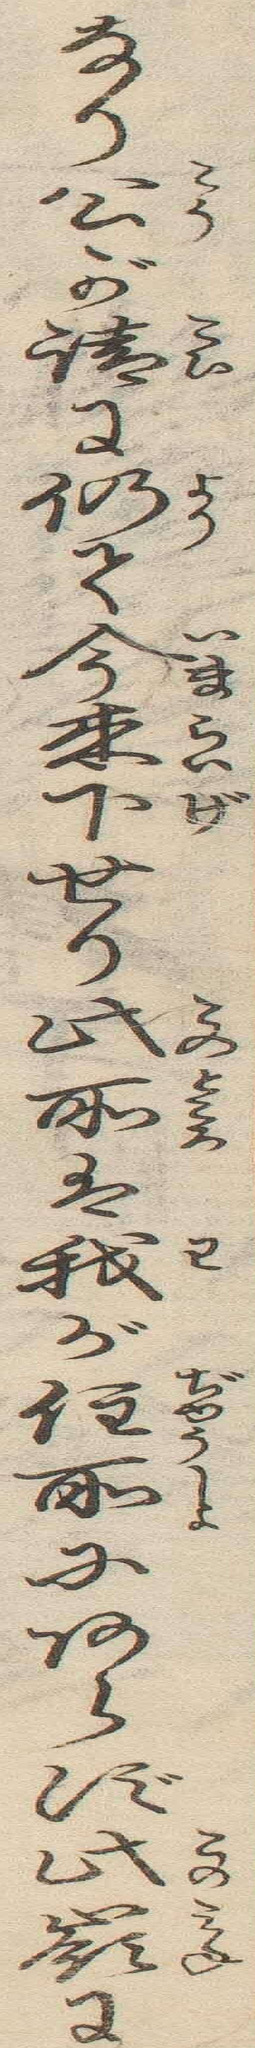なり公が請に仍て今來下せり此所は我が住所にあらず此嶺に
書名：日光山志
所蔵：東京学芸大学附属図書館 国文学研究資料館
